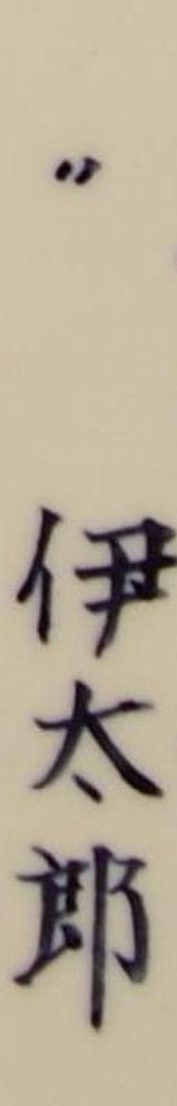伊太郎
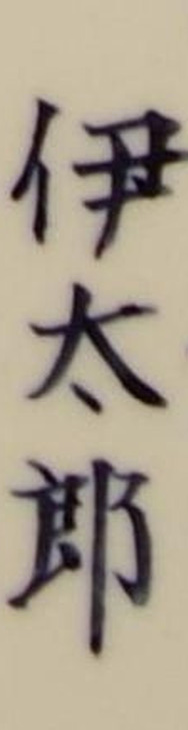伊太郎
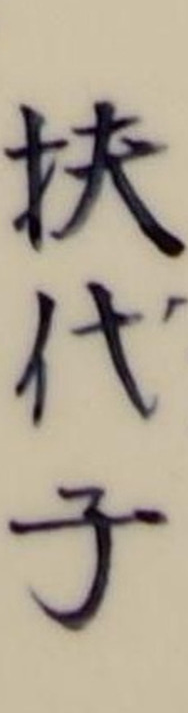扶代子
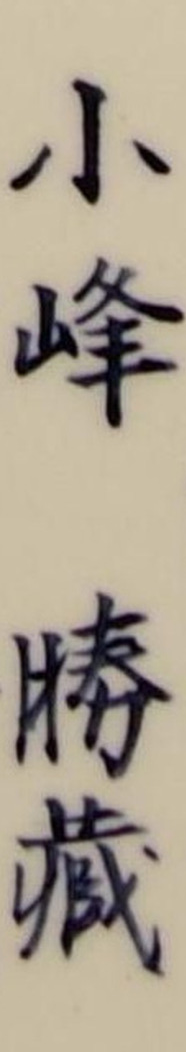小峰勝藏
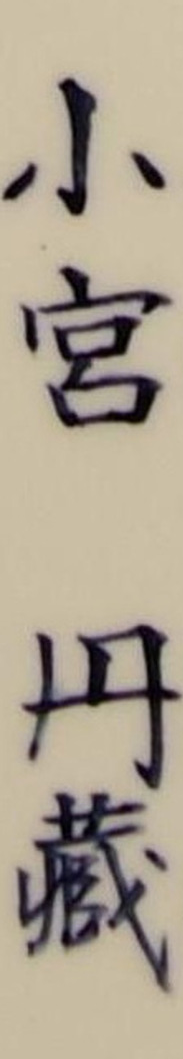小宮円蔵
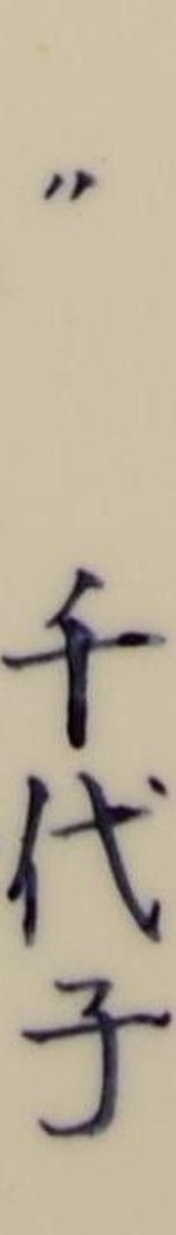千代子
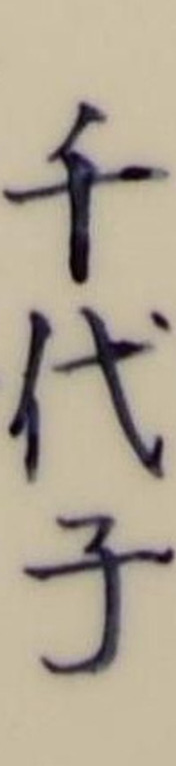千代子
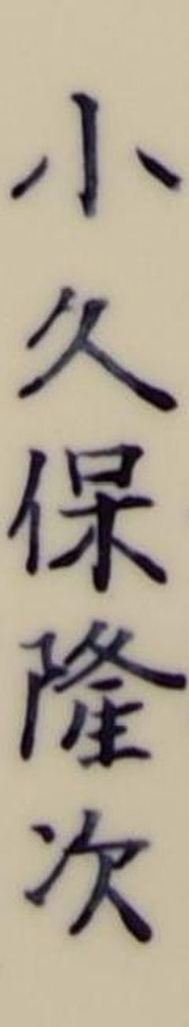小久保隆次
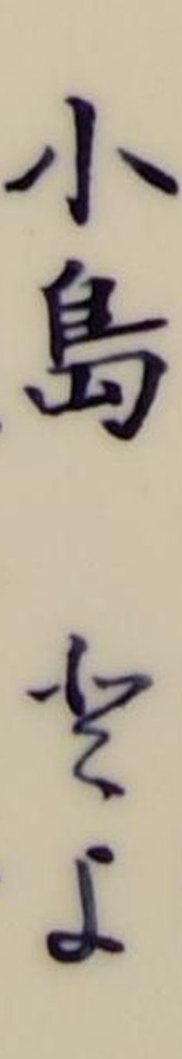小島とよ
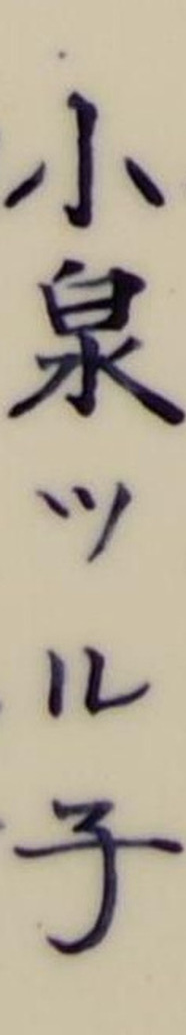小泉ツル子
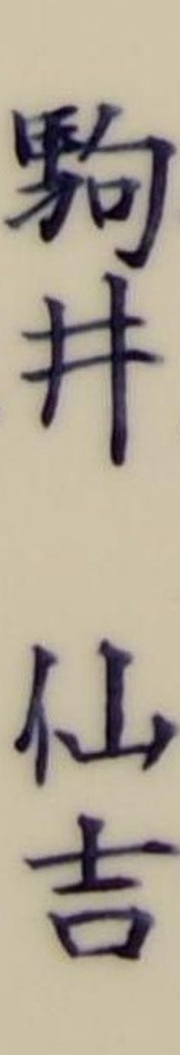駒井仙吉
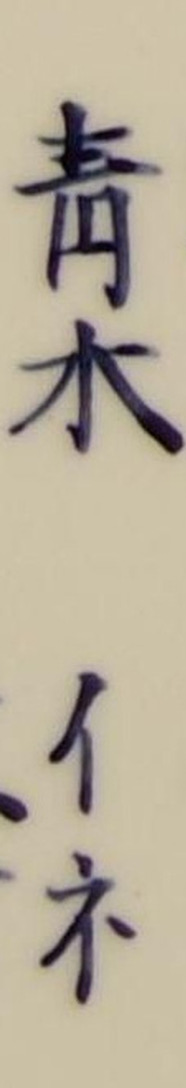青木イネ
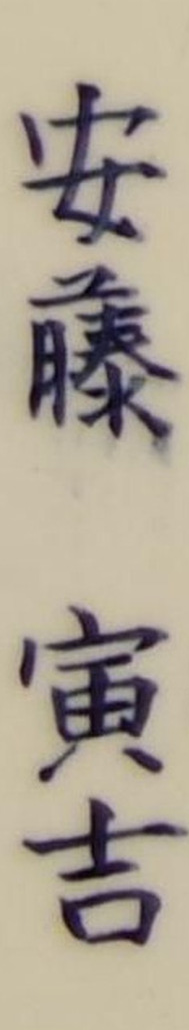安藤寅吉
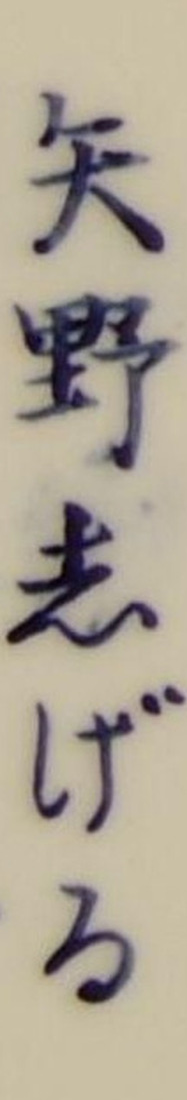矢野しげる
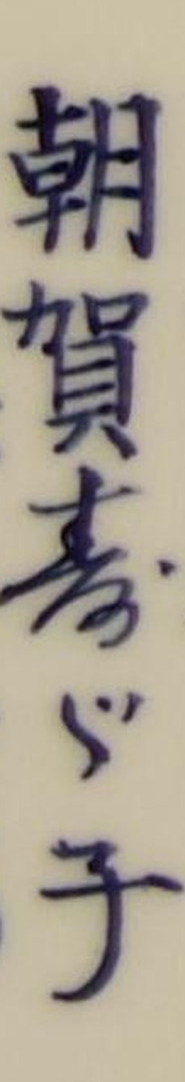朝賀すず子
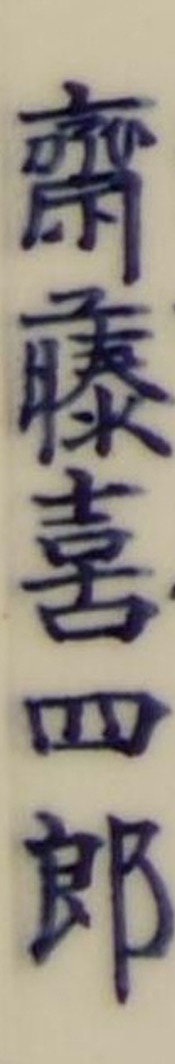齋藤喜四郎
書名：A~D
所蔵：koyasan kongobuji
